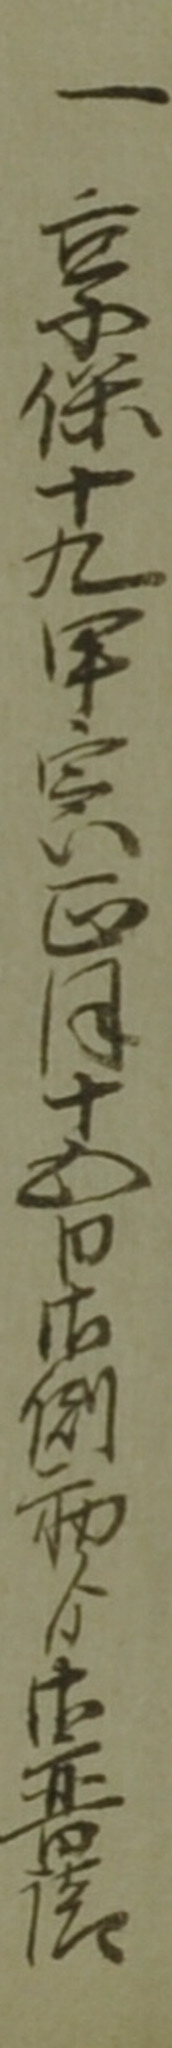一享保十九甲寅正月十五日御側勤ゟ御普請
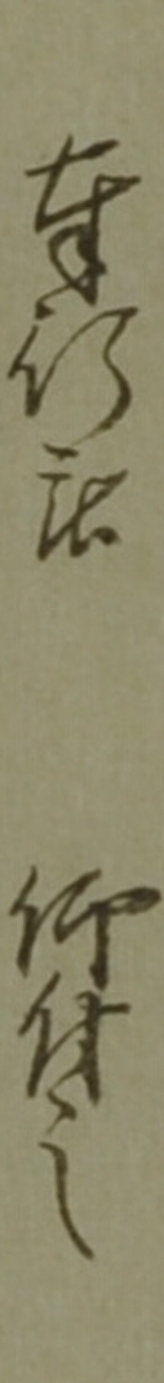奉行被仰付之
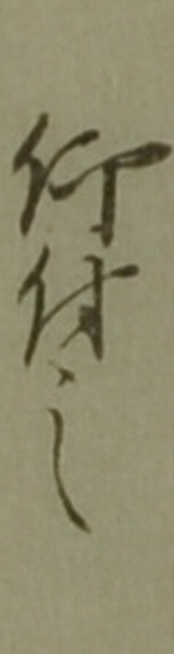仰付之
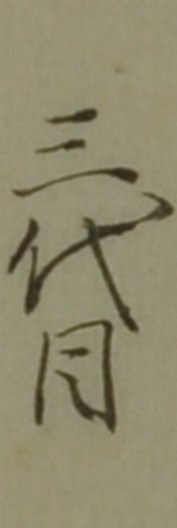三代目
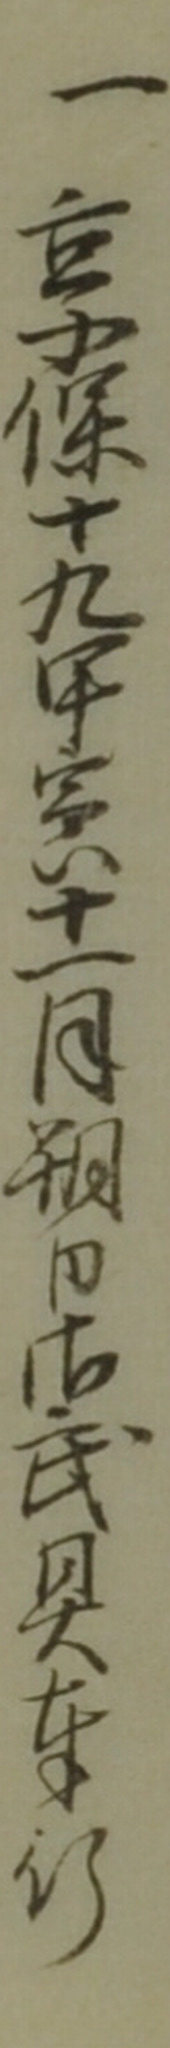一享保十九甲寅十一月朔日御武具奉行
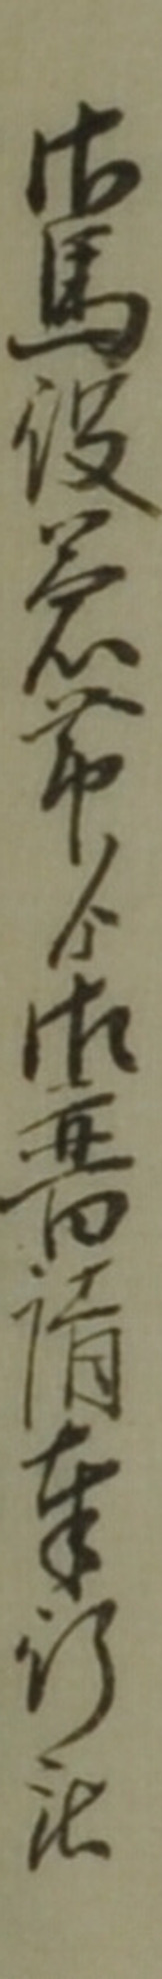御馬役兼帯ゟ御普請奉行被
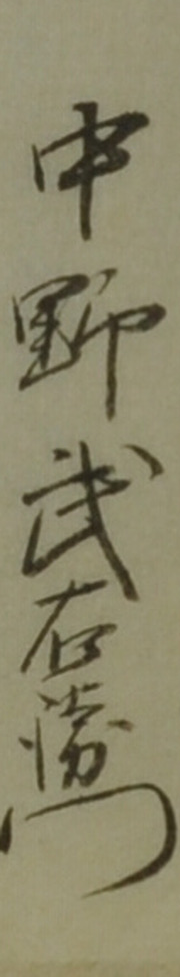中野武右衛門
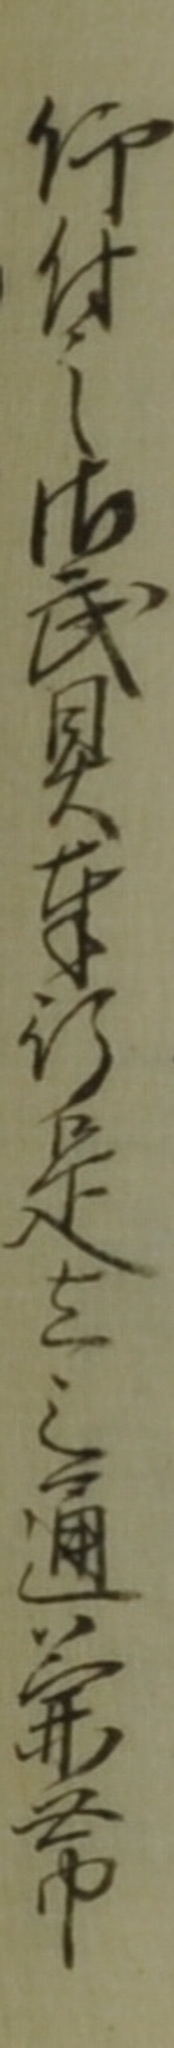仰付之御武具奉行是迄之通兼帯
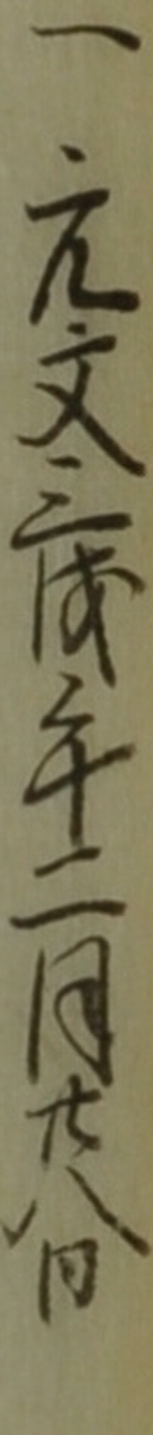一元文三戊午二月廿八日
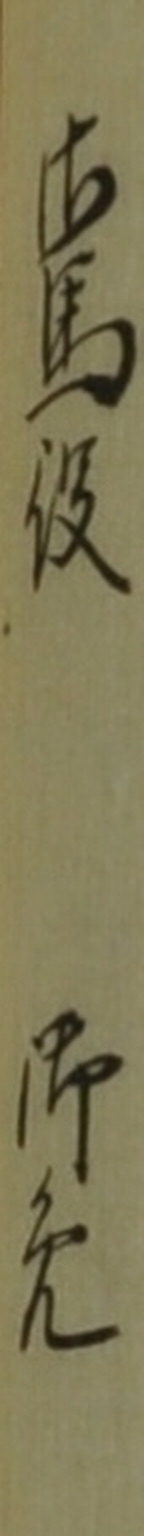御馬役御免
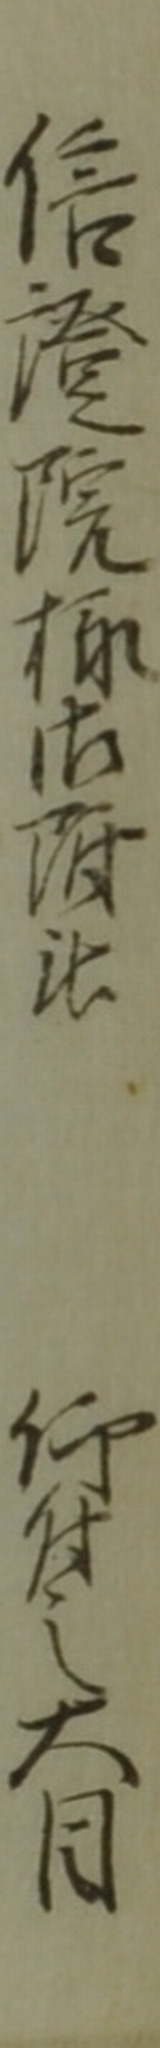信証院様御附被仰付之大目
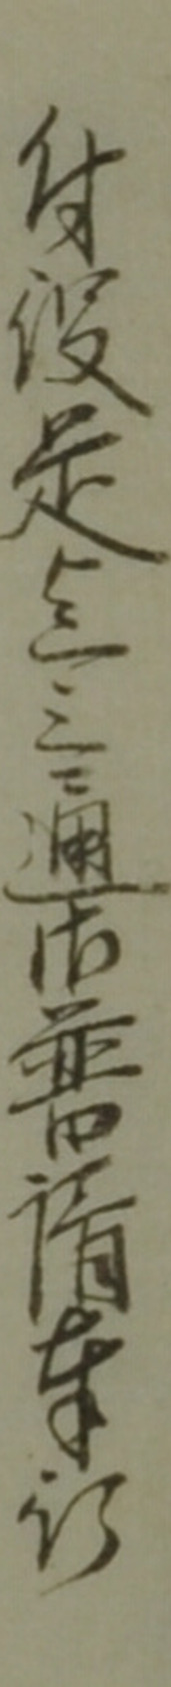付役是迄之通御普請奉行
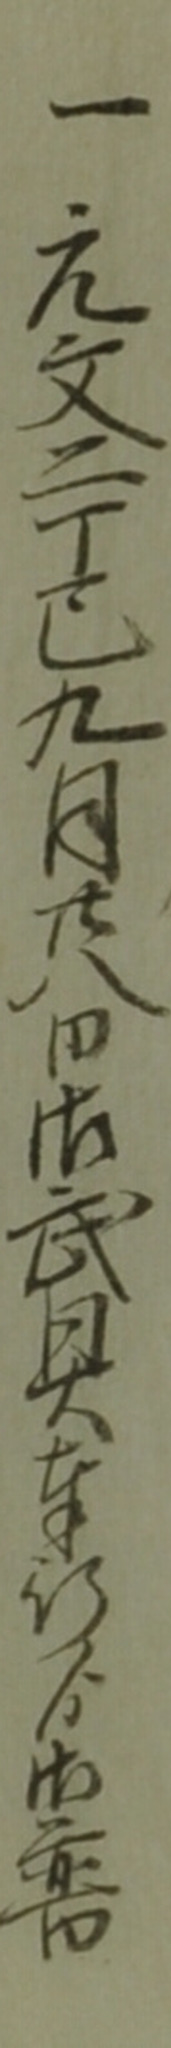一元文二丁巳九月廿八日御武具奉行ゟ御普
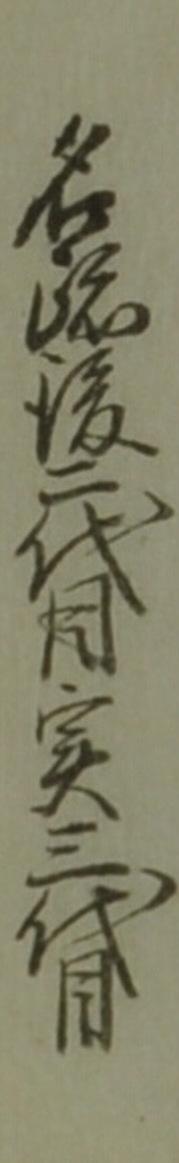名跡後二代目実三代目
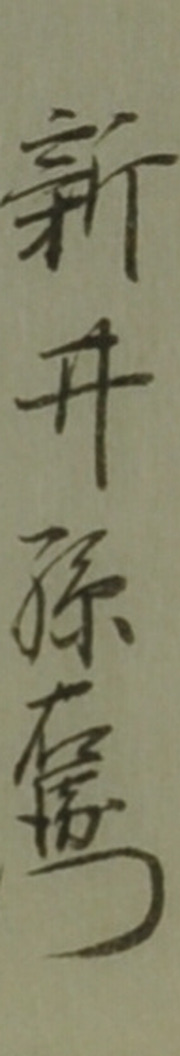新井孫右衛門
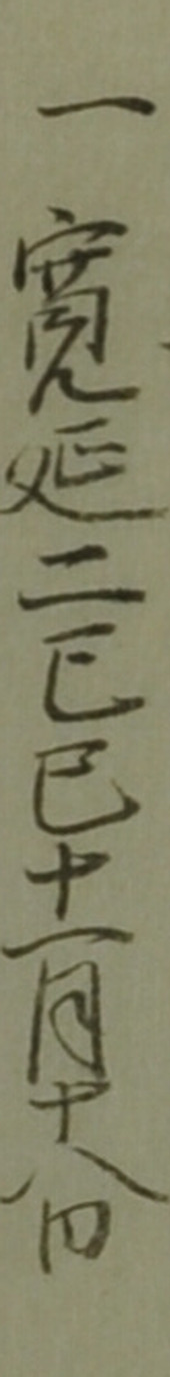一寛延二己巳十一月十八日
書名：諸御役代々録（六）
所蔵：伊那市立高遠町図書館・合同会社AMANE
